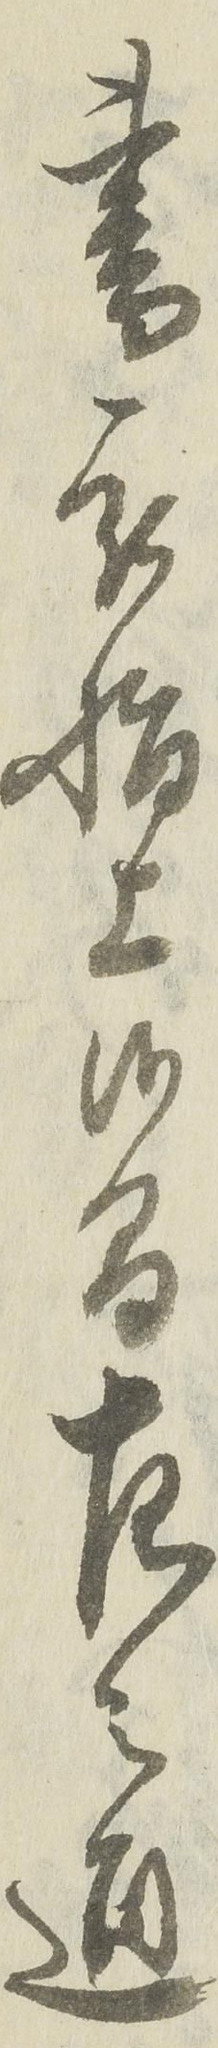書被指上候間左之通

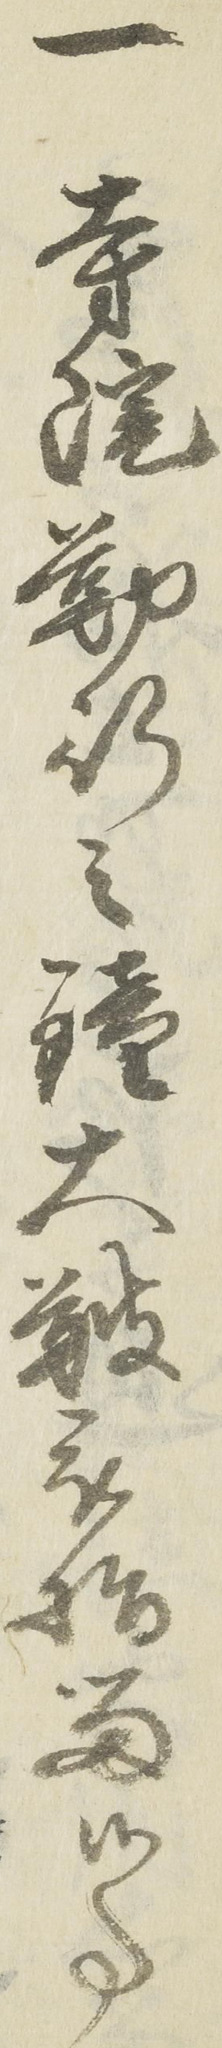一寺院勤行之鐘太鼓被相指留候事
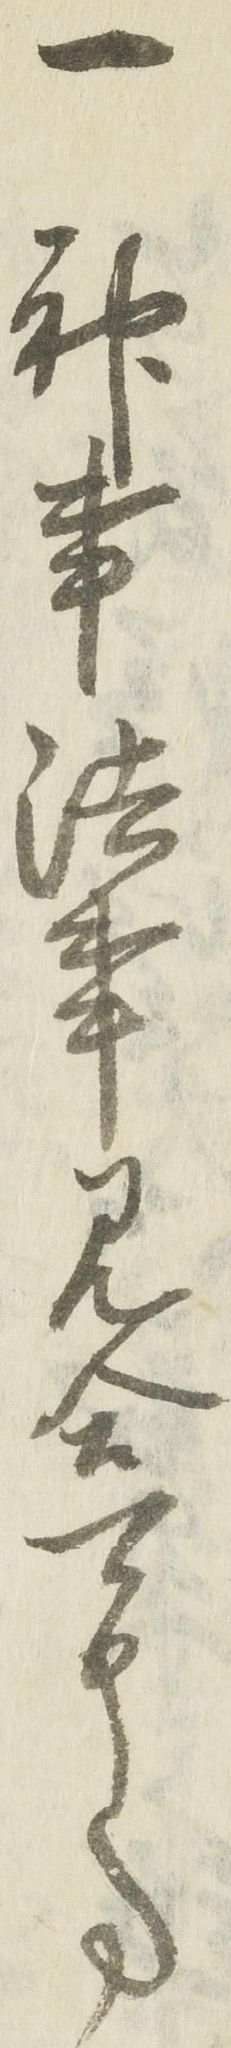一神事法事見合可申事
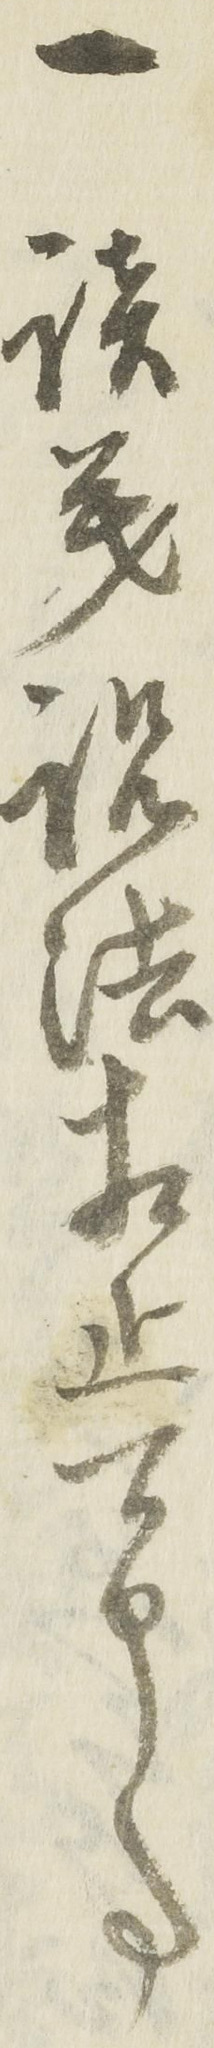一談義説法相止可申事
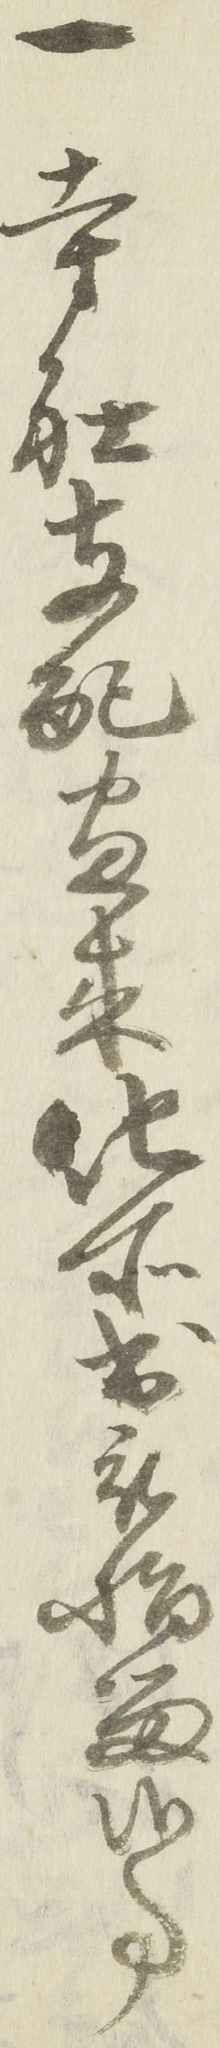一寺社支配家来他所出被指留候事
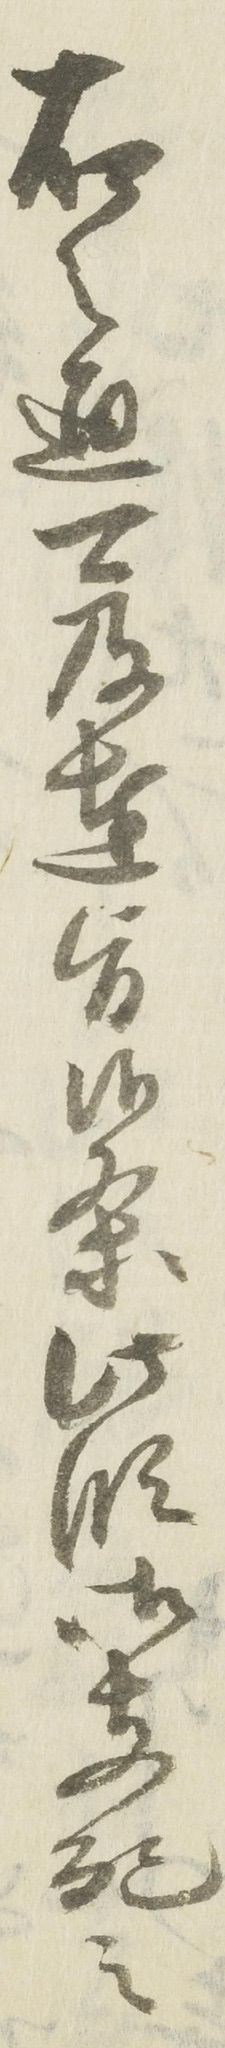右之通可及達旨候条此段御支配之
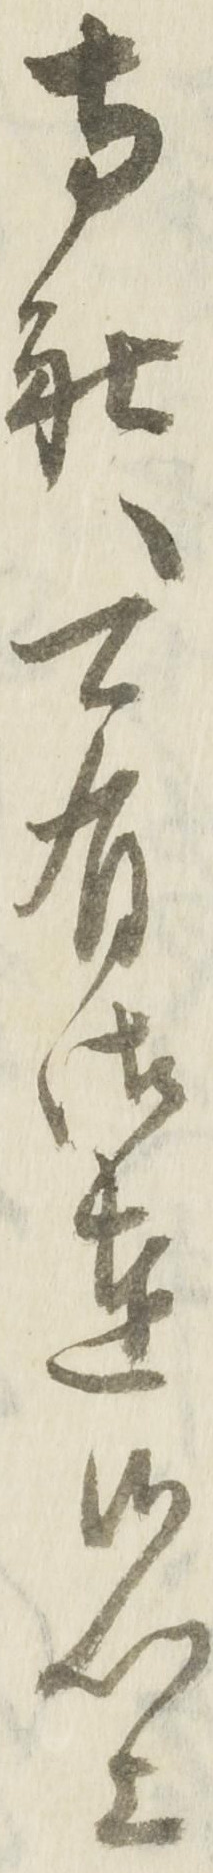寺社へ可有御達候以上
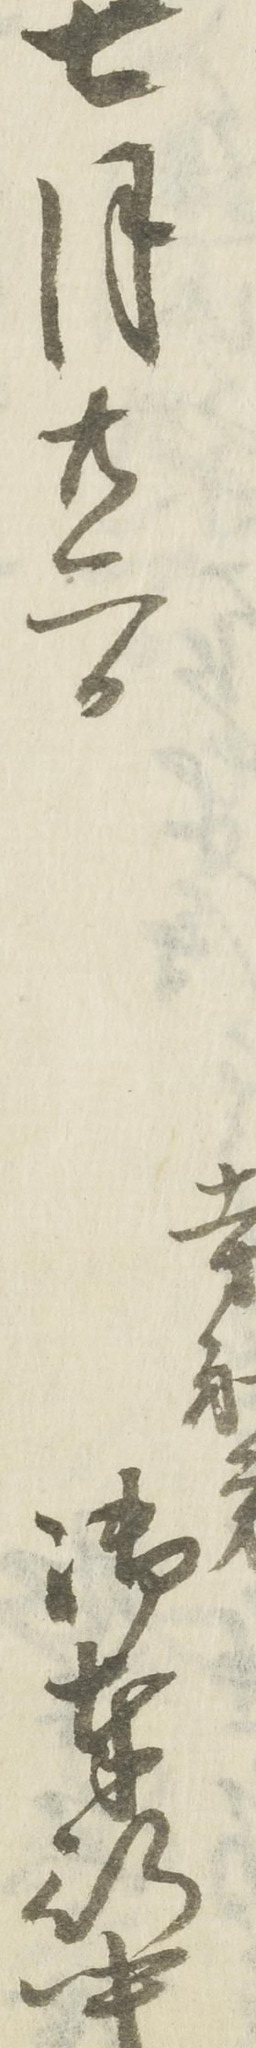七月廿二日御郡代中
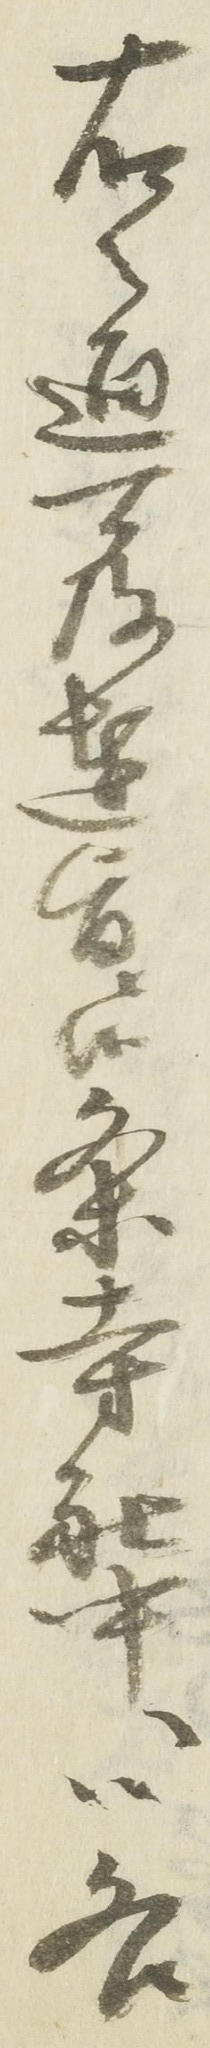右之通可及達旨ニ候条寺社中へハ各
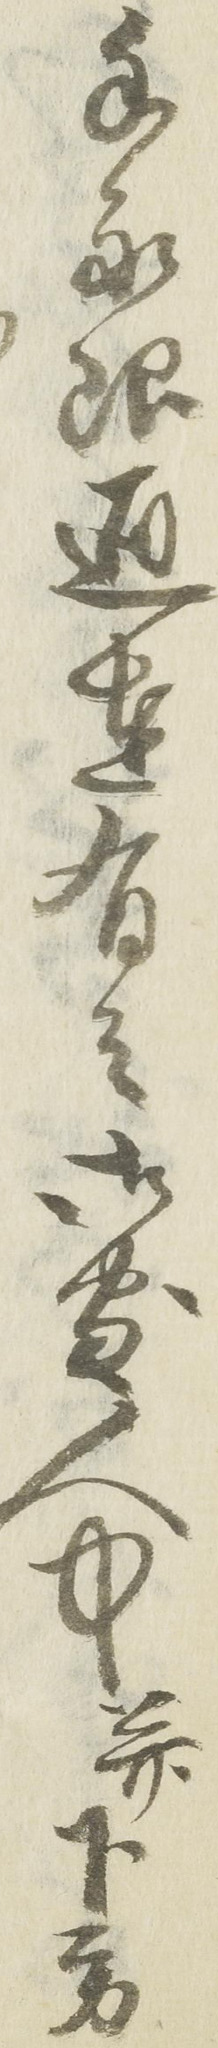手永限通達有之御家人中幷下方
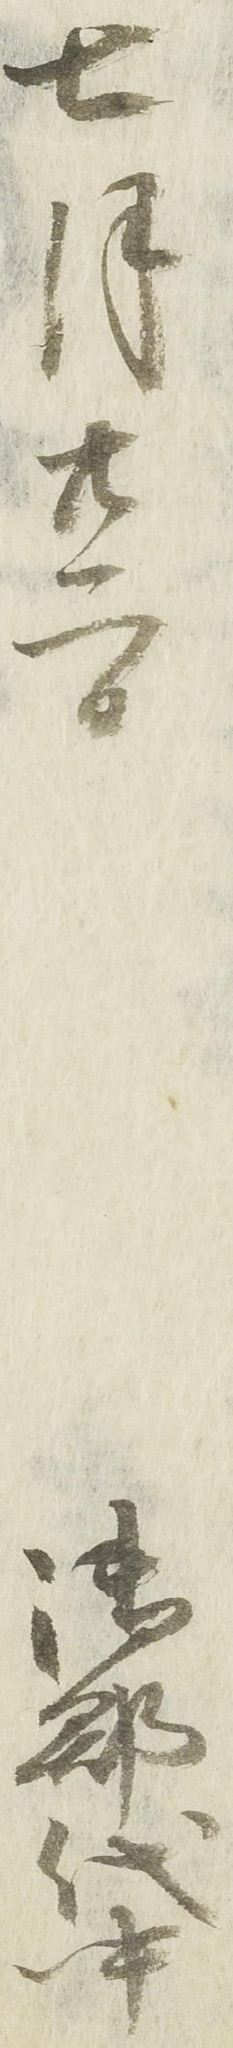七月廿二日御郡代中
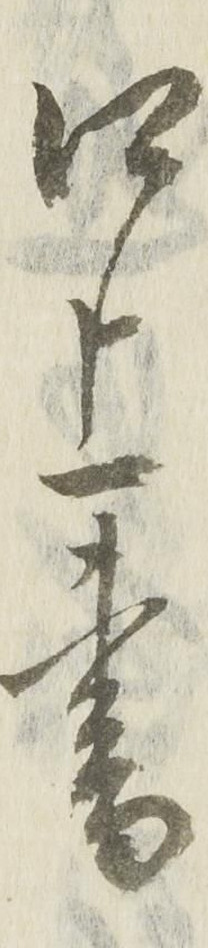口上書
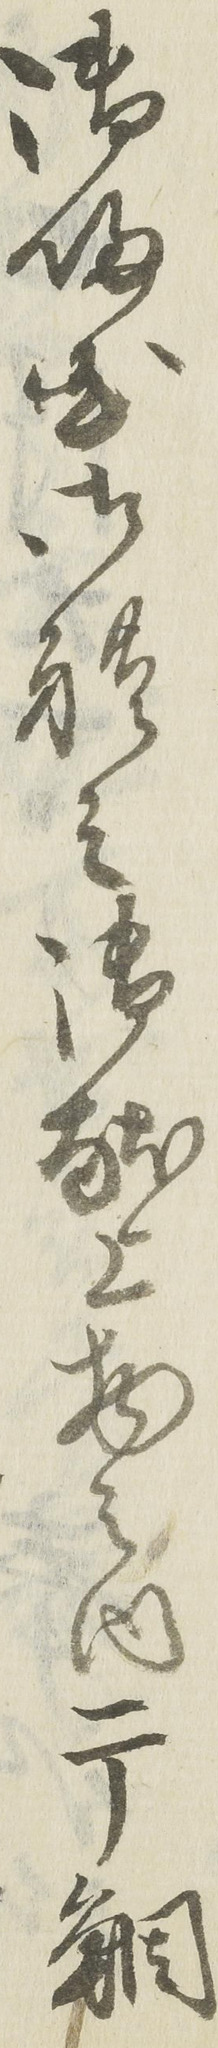御帰国御礼之御献上物之内干鯛
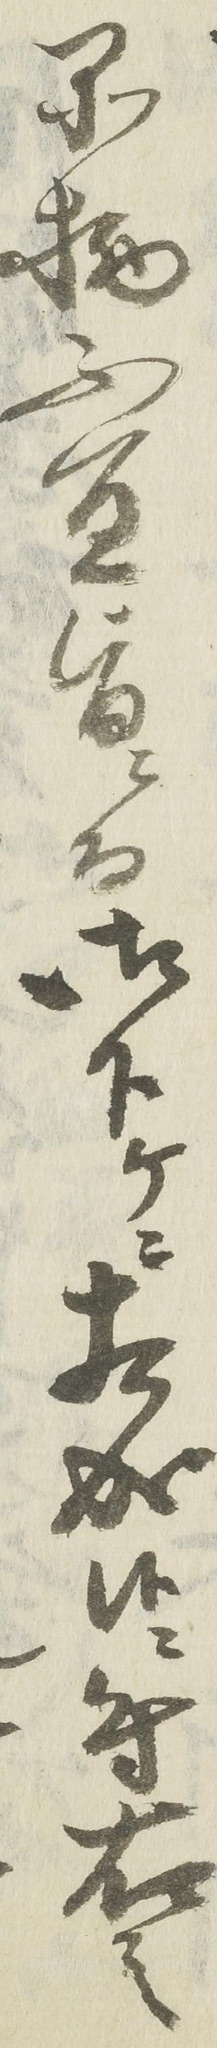品物不宜旨ニ而御下ケニ相成候ニ付右之
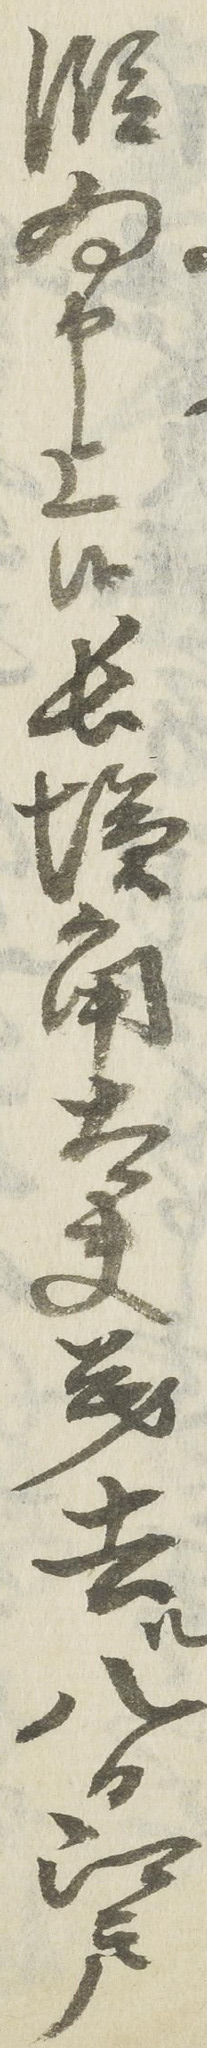段為申上候長塩角太夫義去ル八日江戸
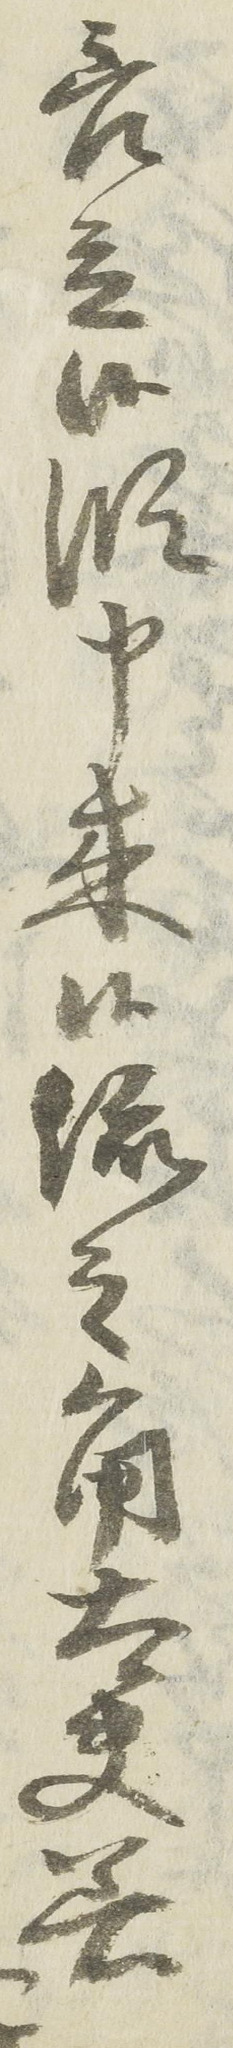着立候段申来候依之角太夫着之上
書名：後見笑
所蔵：東京大学地震研究所図書室 Earthquake Research Institute Library, The University of Tokyo, JAPAN
